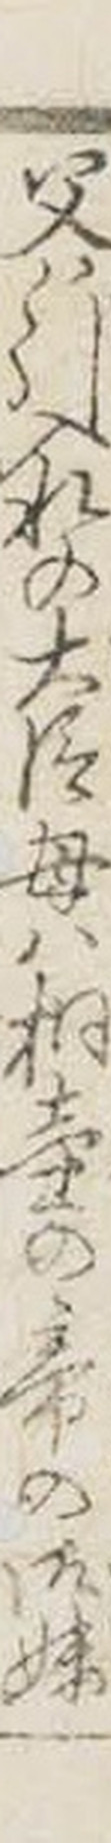父は引入れの大臣母は桐壺の帝の御妹
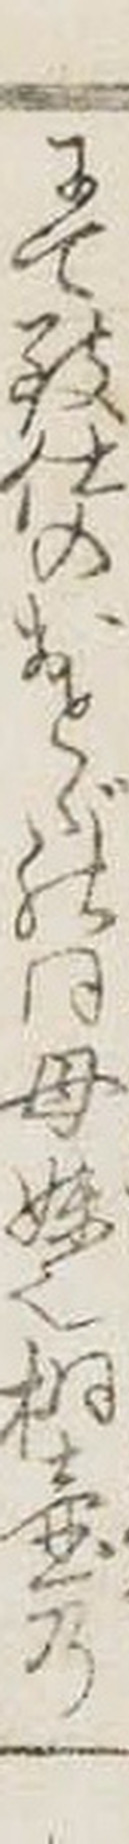にて致仕のおとゞの同母妹也桐壺の
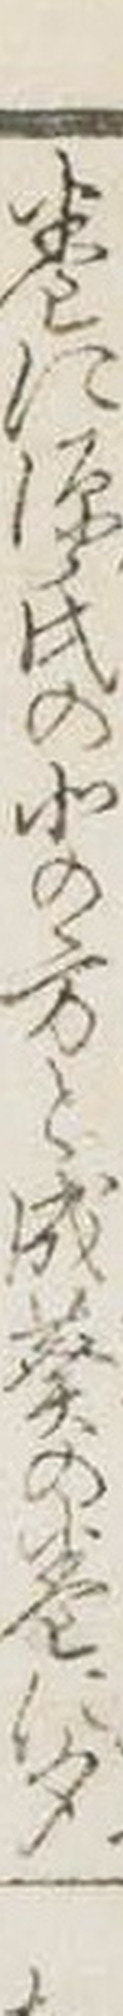巻に源氏の北の方と成葵の巻に夕
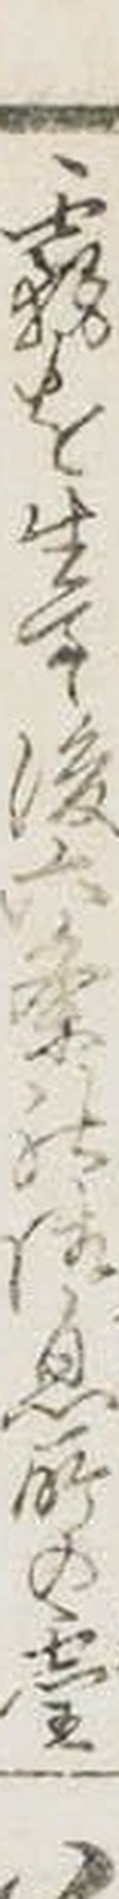霧を生て後六条の御息所の霊
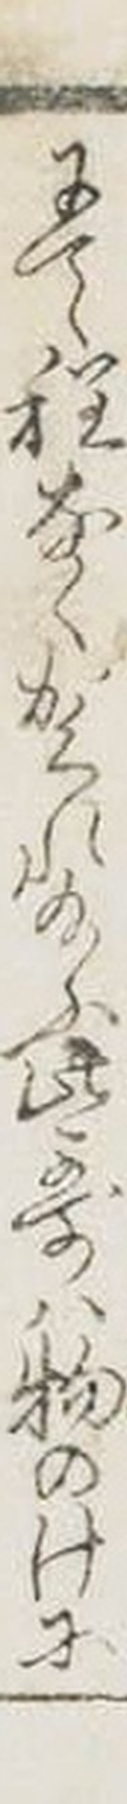にて程なくかくれ給ふ此哥は物のけに
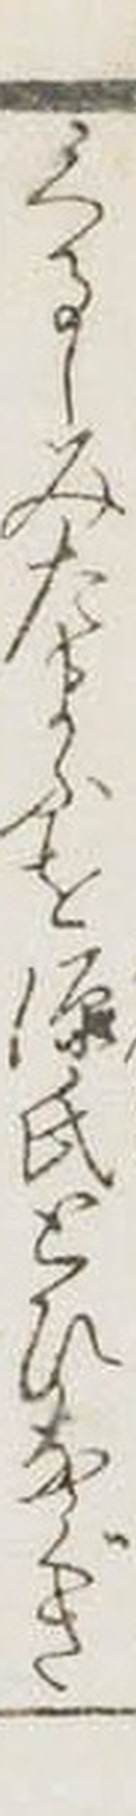くるしみたまふを源氏とひなぐさ
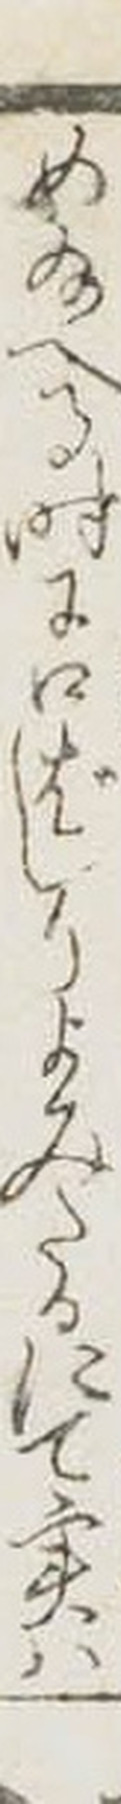め給へる時に口ばしりよみたるにて実は
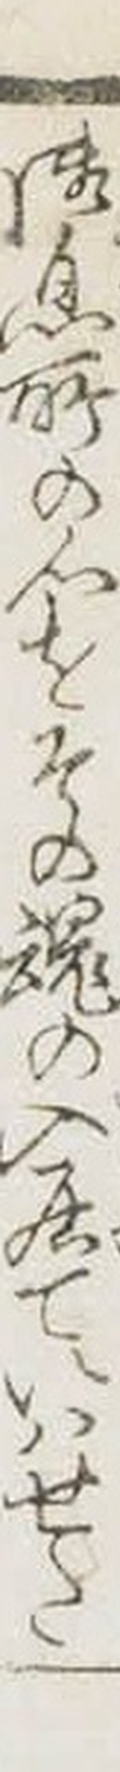御息所の心をその魂の入居ていはせた
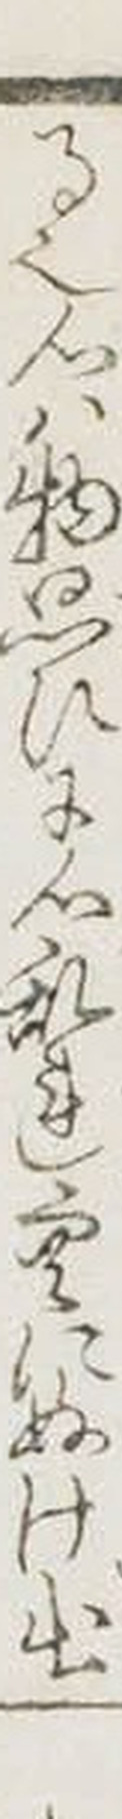る也心は物思ひに心乱れ空にぬけ出
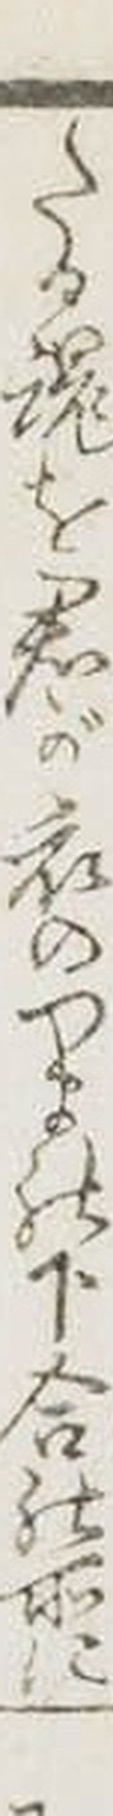たる魂を君が衣のつまの下合の所に
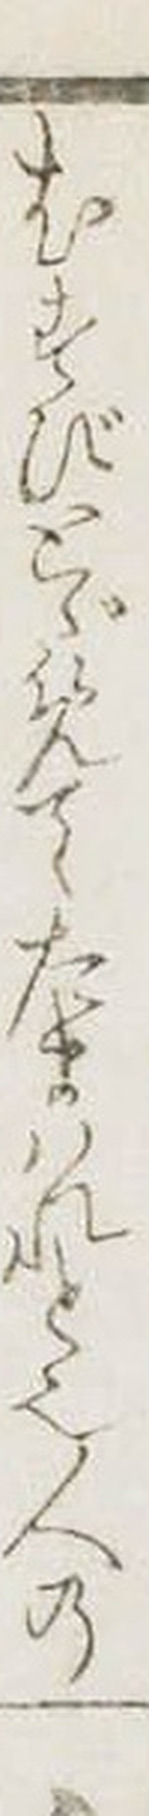むすびとゞめてたまはれと也人の
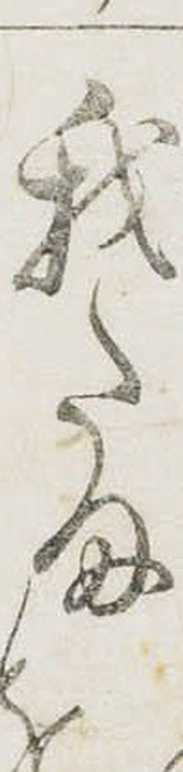我たまを
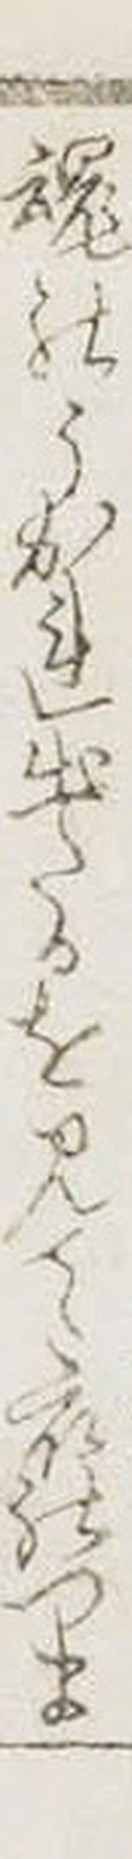魂のうかれ出たるを見て衣のつま
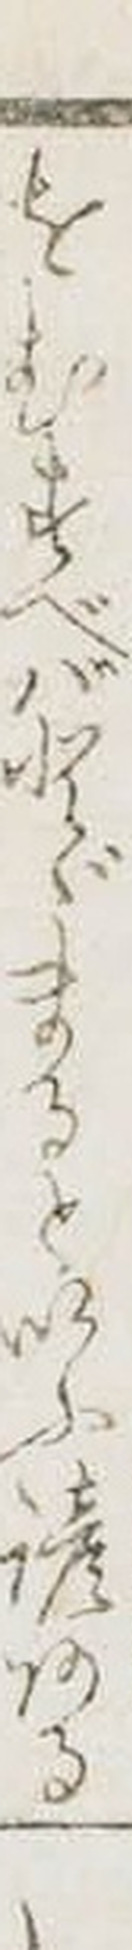をむすべばとゞまるといふ諺ある
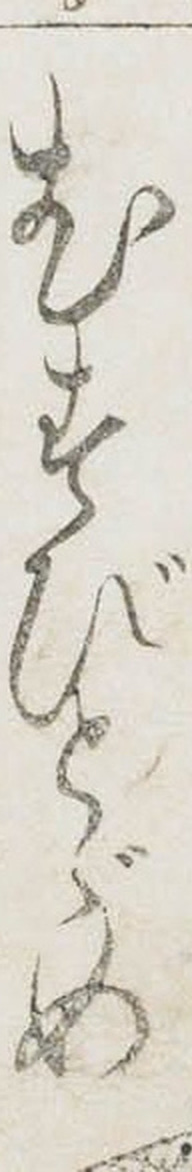むすびとゞめ
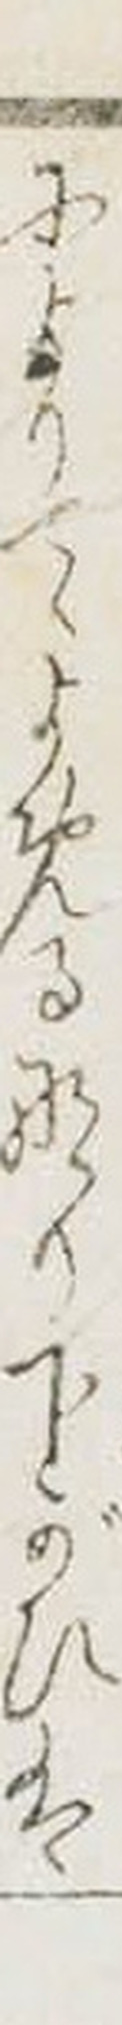によりてよめるなり下がひは
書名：源氏百人一首
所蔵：東京学芸大学教育コンテンツアーカイブ
